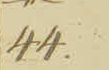44.
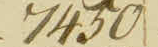7450
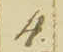4.
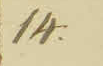14.
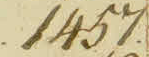1457.
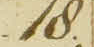18.
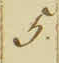5.
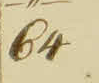64
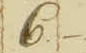6.
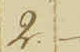2.
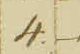4.
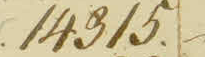14315.
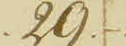29.
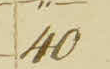40
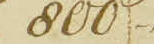800
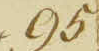95
